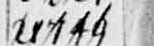21749
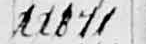22871
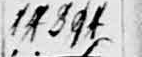14394
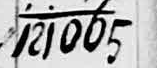121065
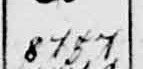8757
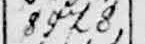8528
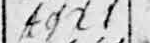4921
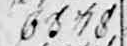6378
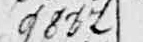9832
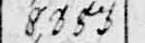8353
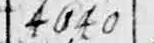4640
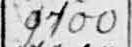9700
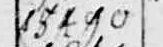15490
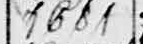7681
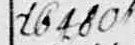26480
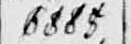6885
